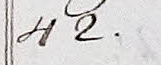42.
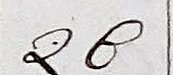26
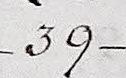39
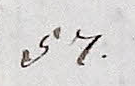57.
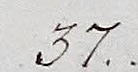37.
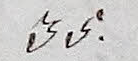35.
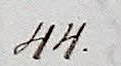44.
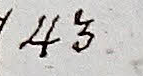43
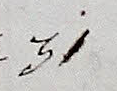31
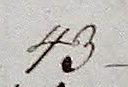43
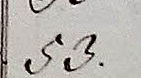53.
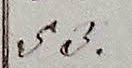53.
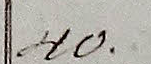40.
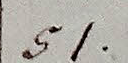51
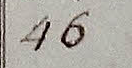46
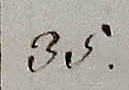35
